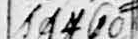11460
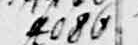4086
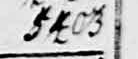5403
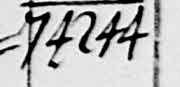74244
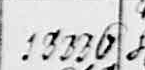13336
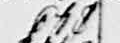678
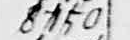8750
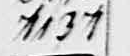7137
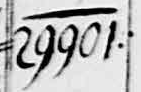29901
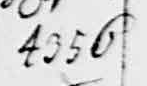4356
